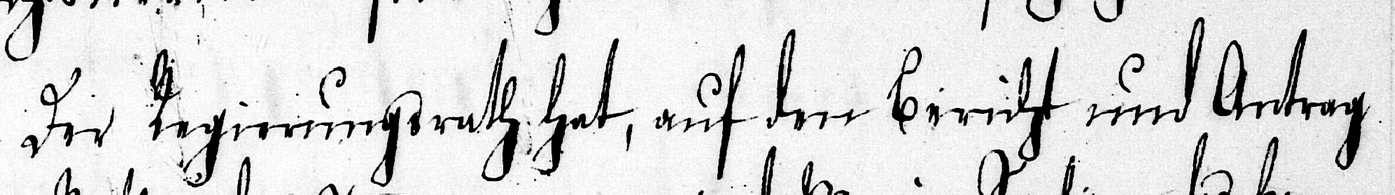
Der Regierungsrath hat, auf den Bericht und Antrag
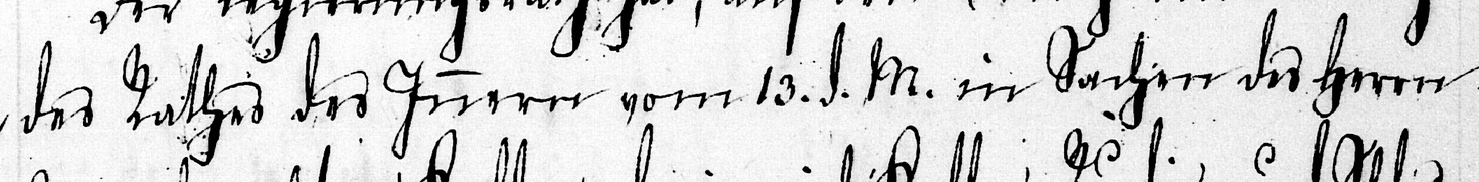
des Rathes des Innern vom 13. d. M. in Sachen des Herrn
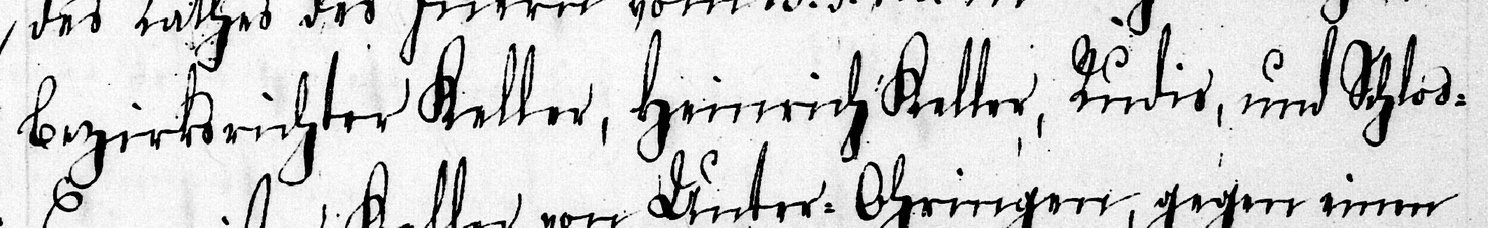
Bezirksrichter Keller, Heinrich Keller, Rudis, und Schloß¬
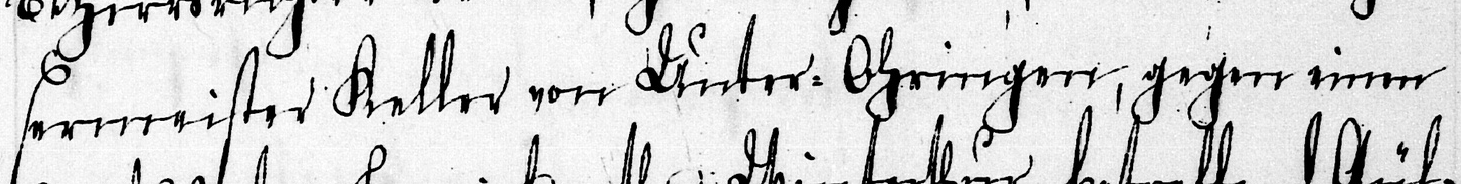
ermeister Keller von Unter-Ohringen, gegen einen
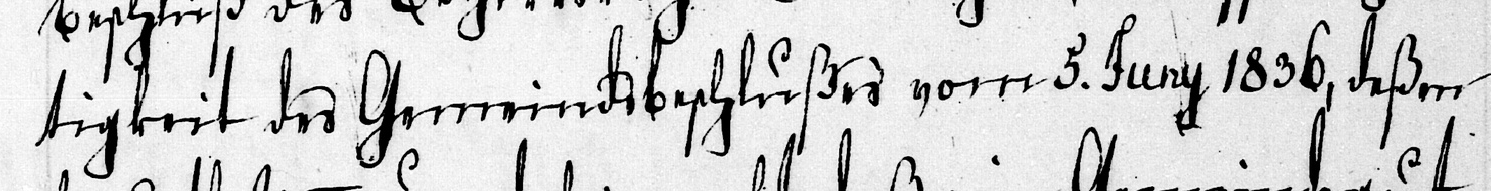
tigkeit des Gemeindsbeschlußes vom 5. Juny 1836, deßen
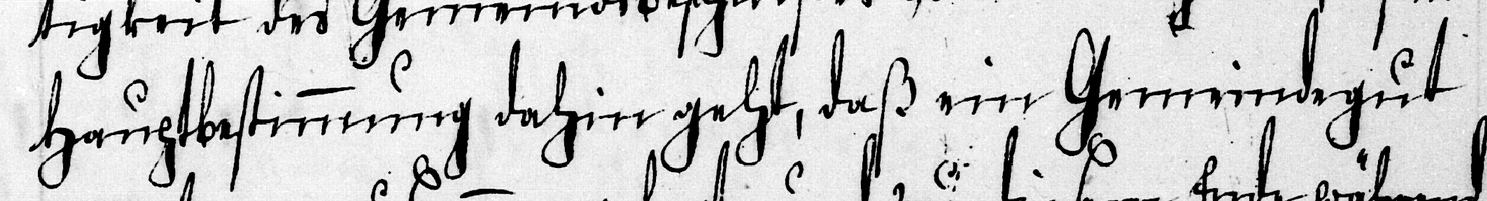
Hauptbestimmung dahin geht, daß ein Gemeindegut
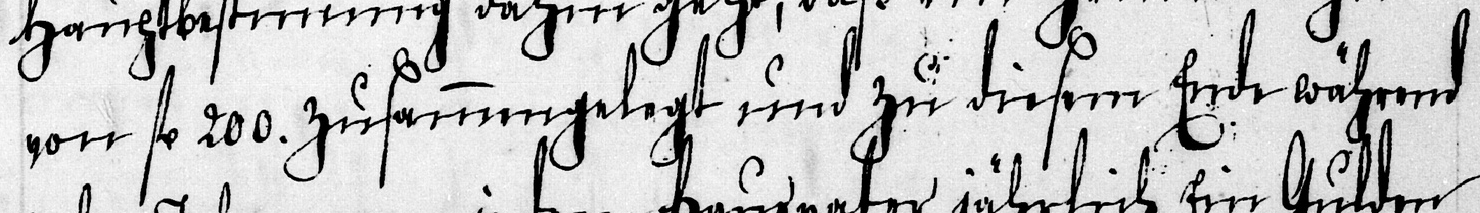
von fl 200. zusammengelegt und zu diesem Ende während
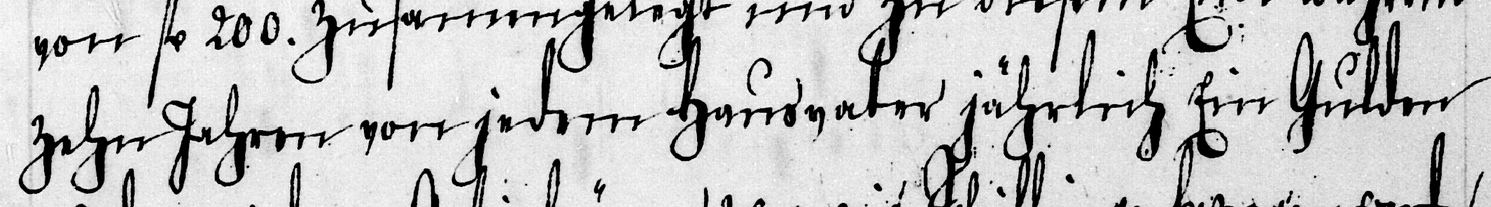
zehn Jahren von jedem Hausvater jährlich ein Gulden
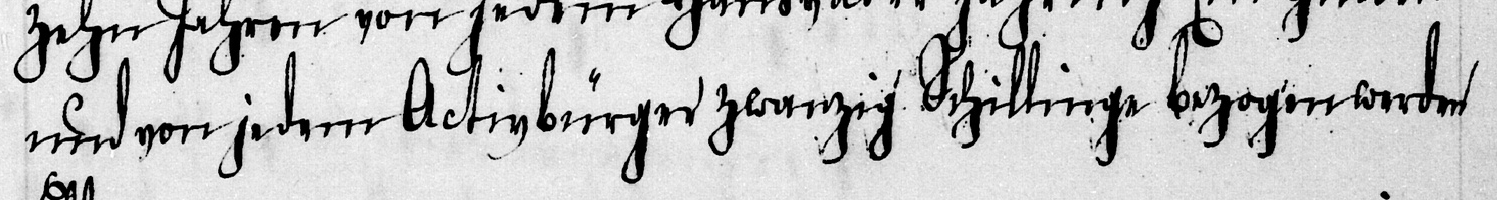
und von jedem Activbürger zwanzig Schillinge bezogen werden
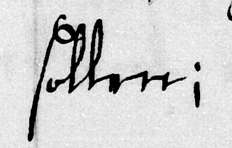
sollen;
